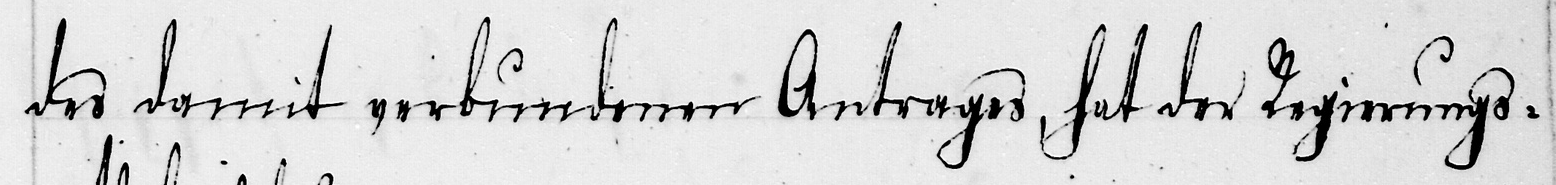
des damit verbundenen Antrages, hat der Regierungs¬
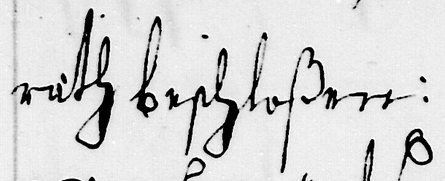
rath beschloßen:
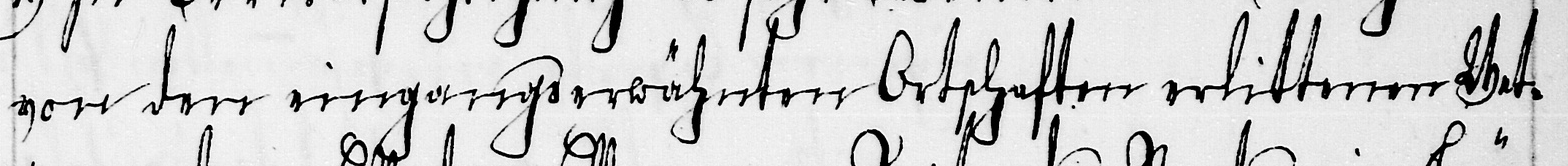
von den eingangs erwähnten Ortschaften erlittenen Wet¬
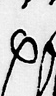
3.
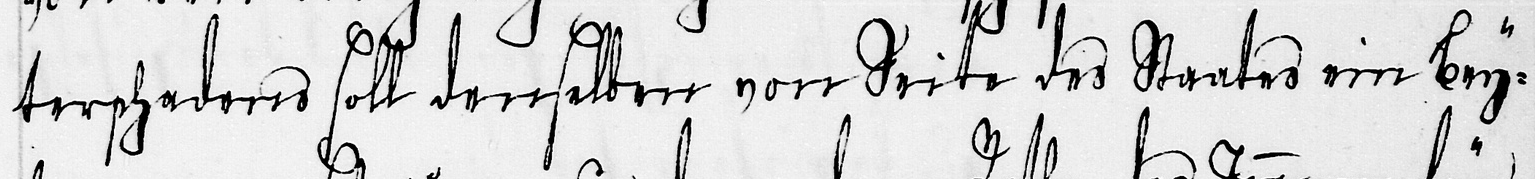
terschadens soll denselben von Seite des Staates ein Bey¬
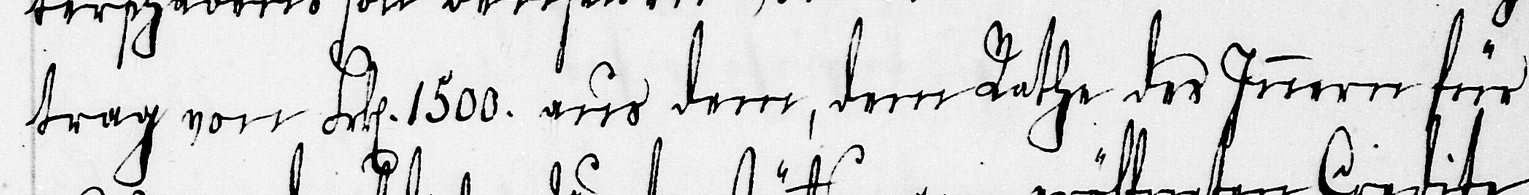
trag von Frk[en]. 1500. aus dem, dem Rathe des innern für
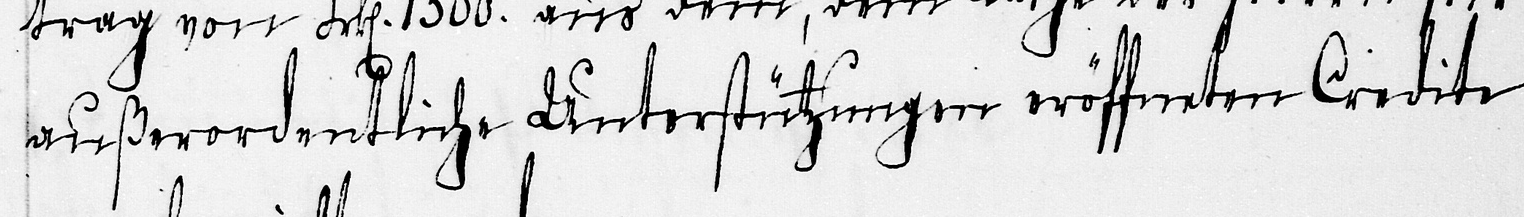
außerordentliche Unterstützungen eröffneten Credite
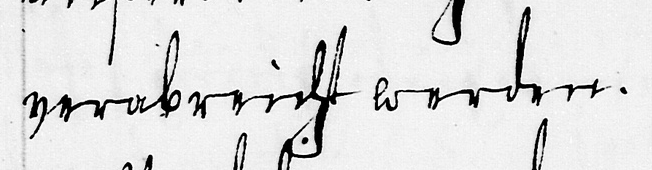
verabreicht werden.
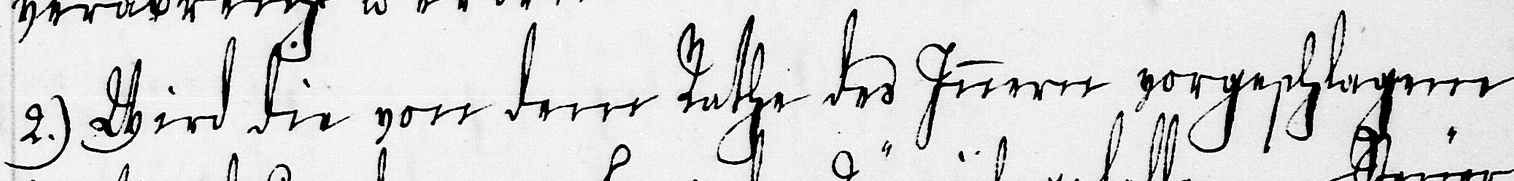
2.) Wird die von dem Rathe des Innern vorgeschlagene
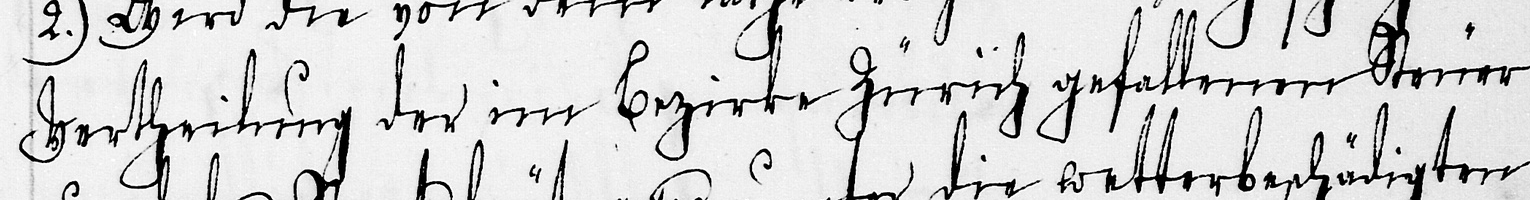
Vertheilung der im Bezirke Zürich gefallenen Steuer
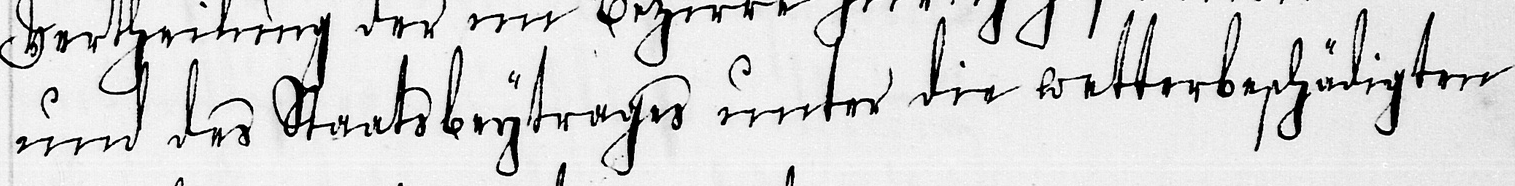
und des Staatsbeyrages unter die wetterbeschädigten
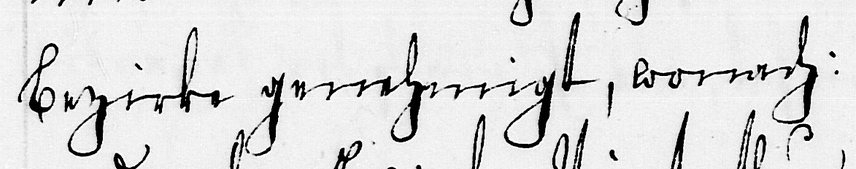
Bezirke genehmigt, wonach:
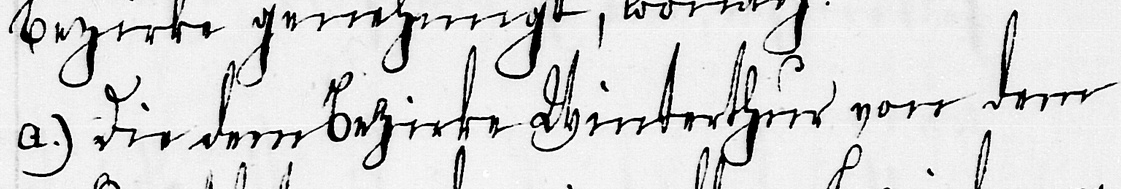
a.) Die dem Bezirke Winterthur von dem
